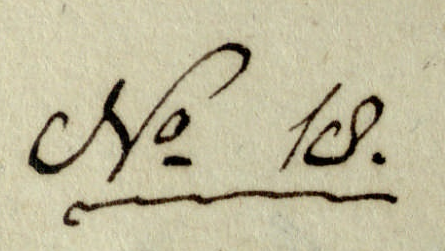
No 18.
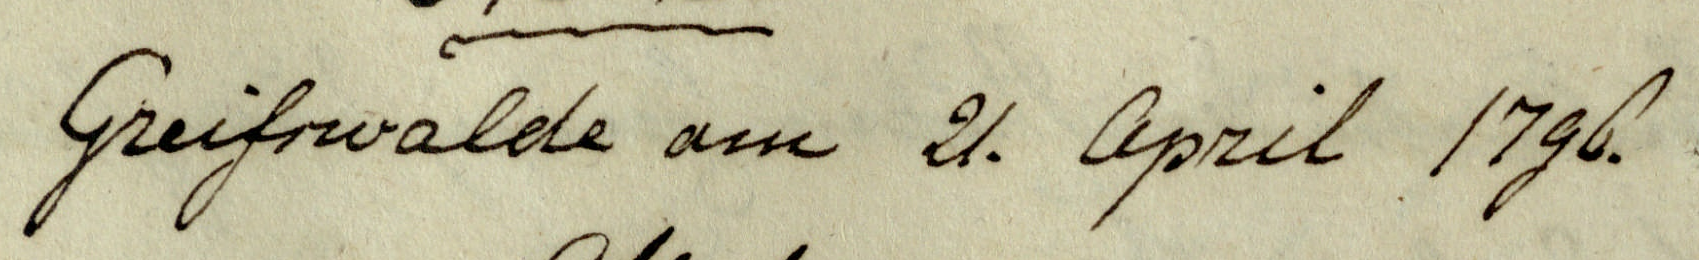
Greifswalde am 21. April 1796.
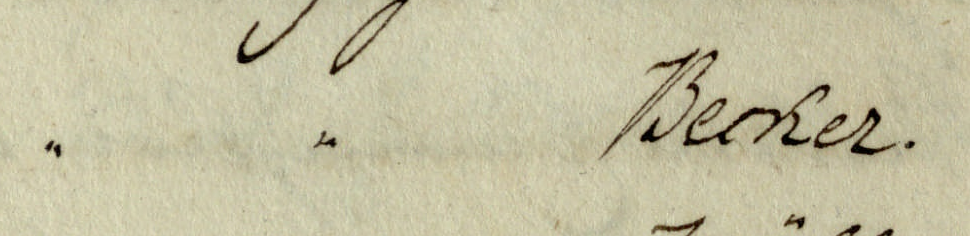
Becker.
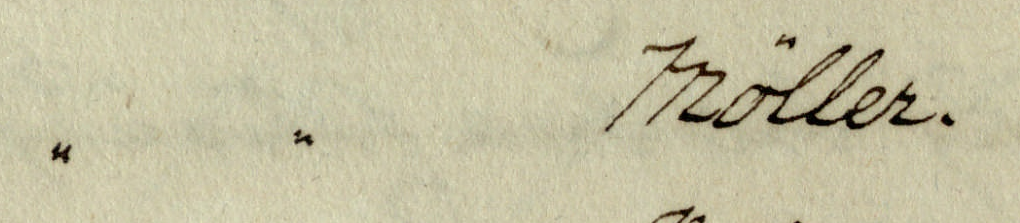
Möller.
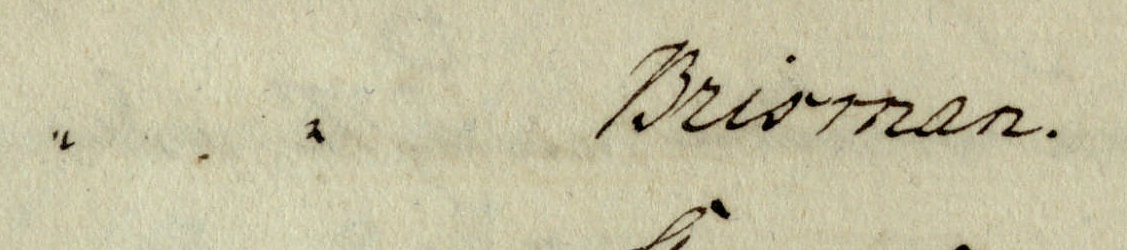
Brisman.
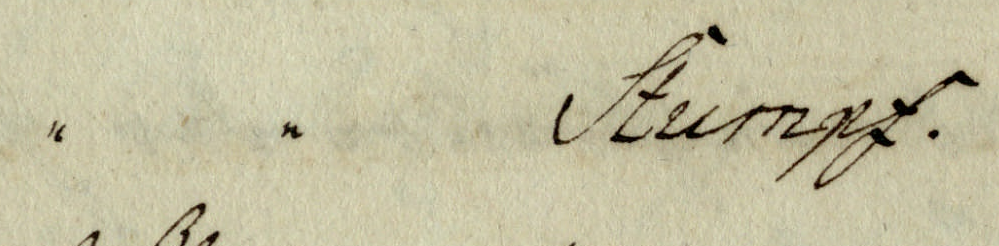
Stumpf.
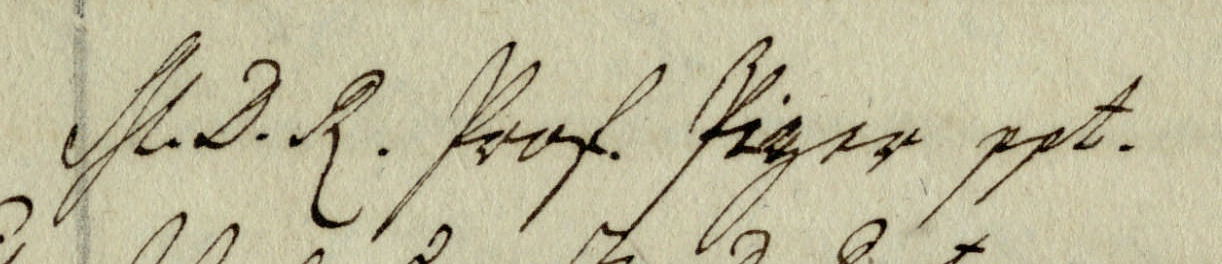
M. D. R. Prof. Piper ppt.
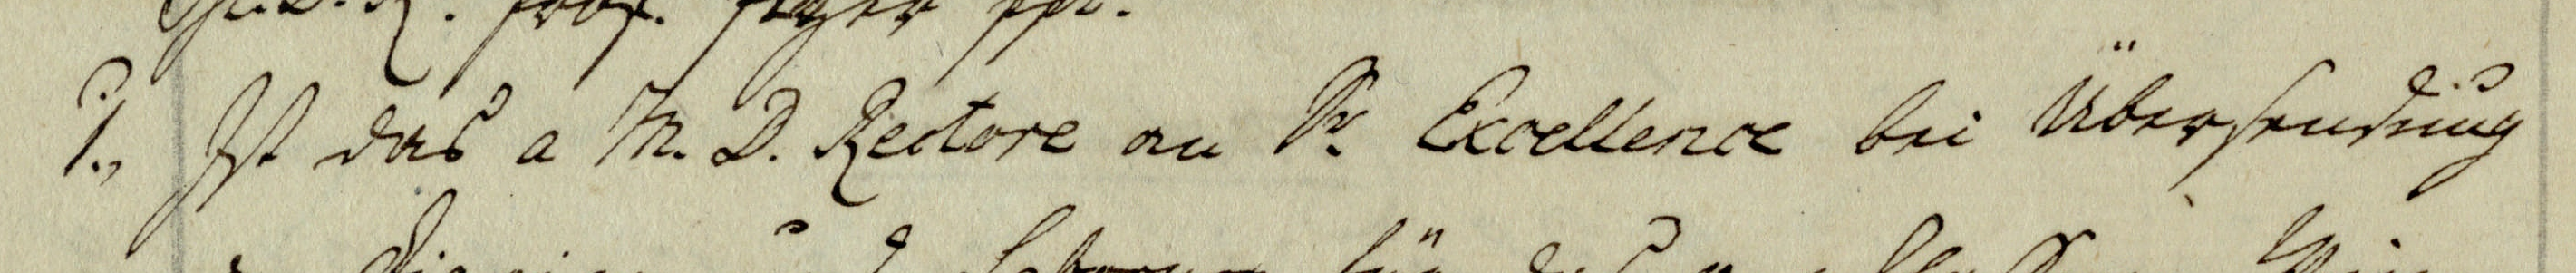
1., Ist das a M. D. Rectore an Sr. Excellence bei Übersendung
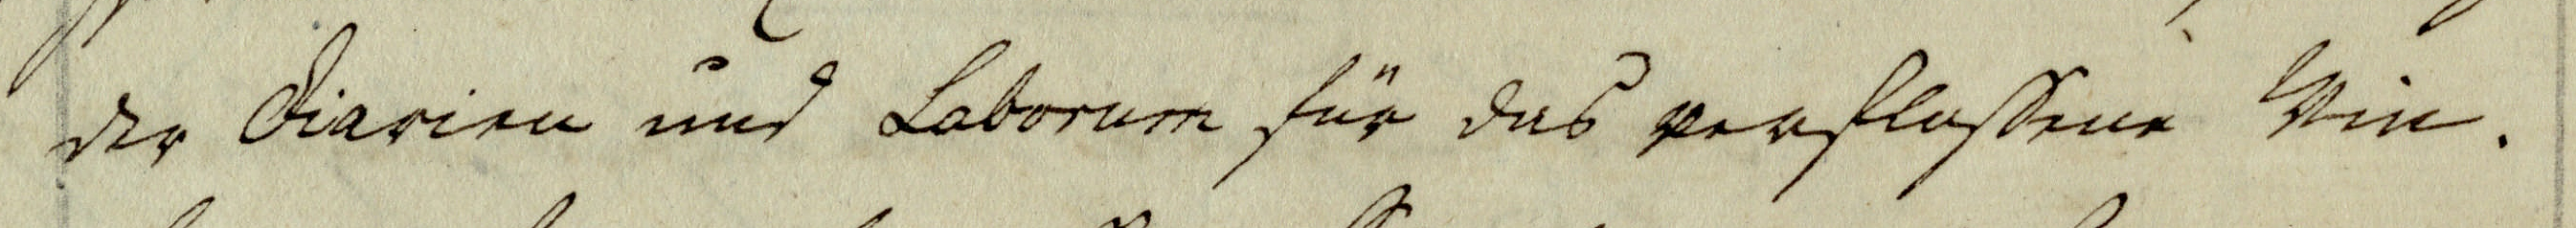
der Darien und Laborum für das verflossene Win¬
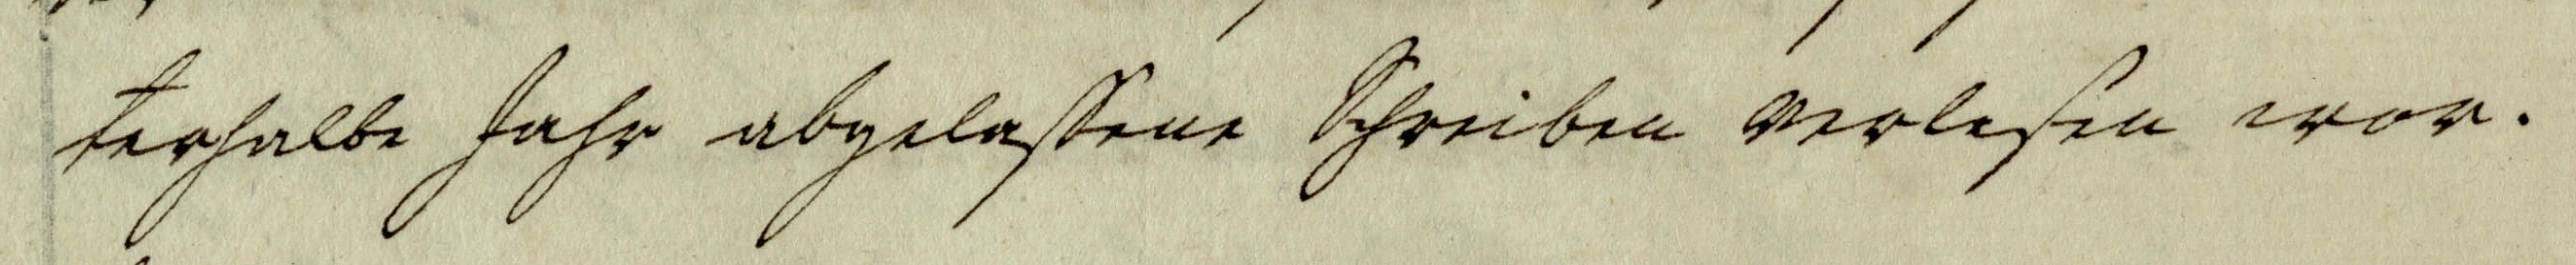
terhalbe Jahr abgelassene Schreiben verlesen wor¬
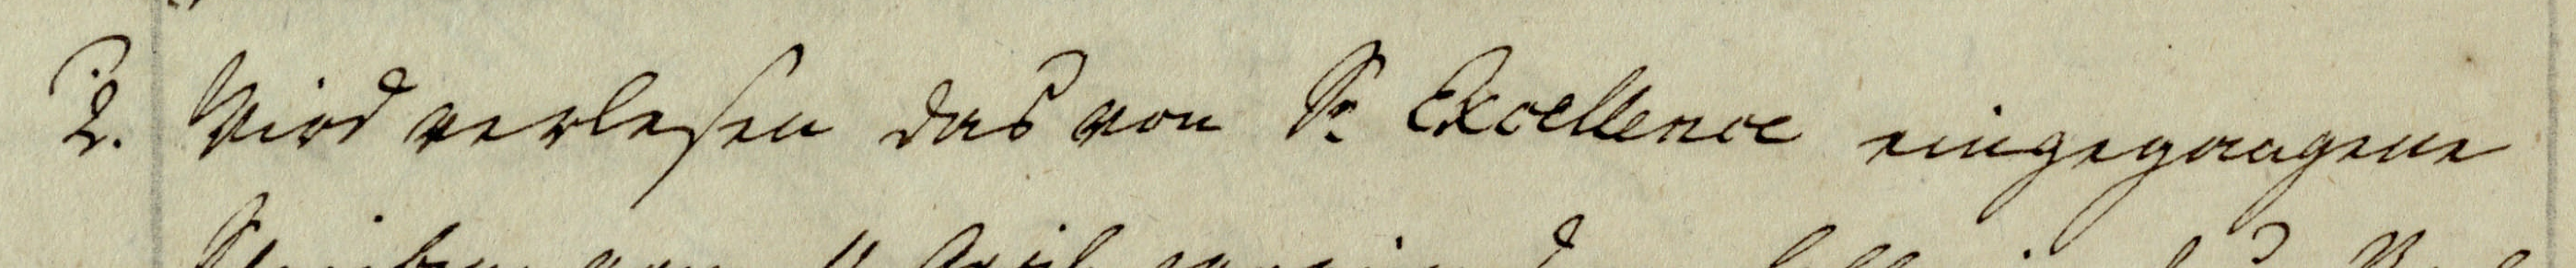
2. Wird verlesen das von Sr Excellence eingegangene
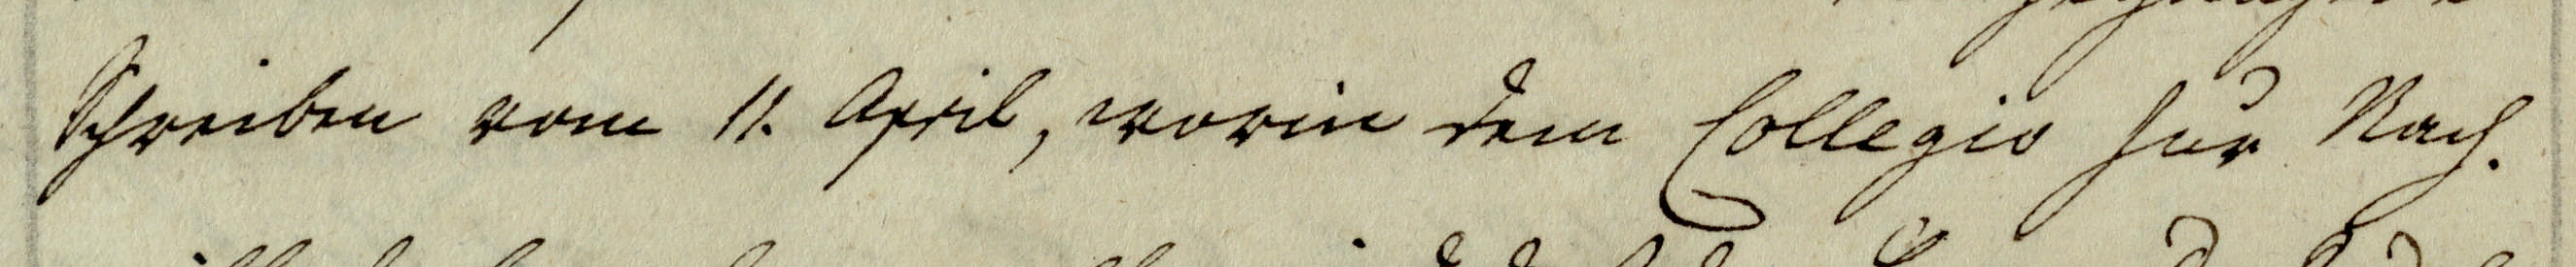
Schreiben vom 11. April, worin dem Collegio zur Nach¬
